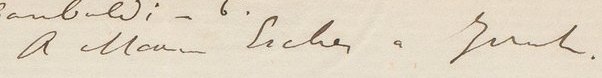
A Mons Escher a Zurich.
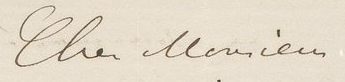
Cher Monsieur
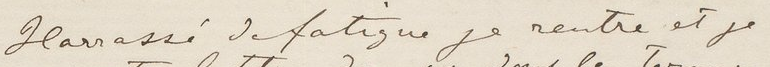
Harrassé de fatigue je rentre et je
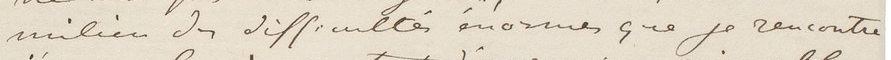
milieu des difficultés énormes que je rencontre
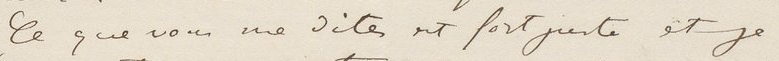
Ce que vous me dites est fort juste et je
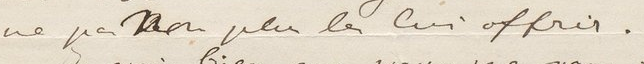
ne pas non plus les lui offrir.
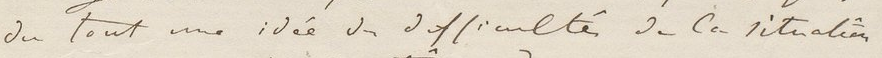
du tout une idée des difficultés de la situation
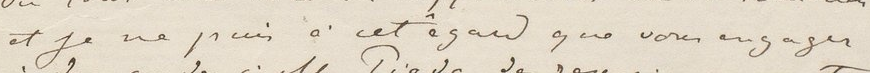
et je ne puis à cet égard que vous engager
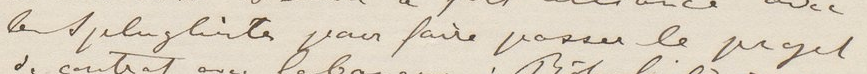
les Spluglistes pour faire passer le projet
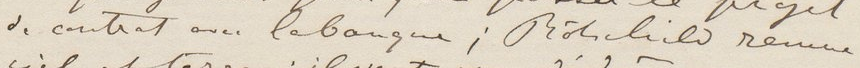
de contrat avec la banque; Rôtschild remue
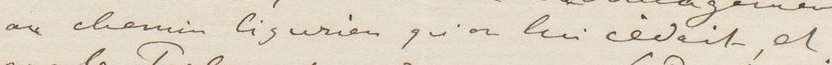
au chemin ligurien qu'on lui cédait, et
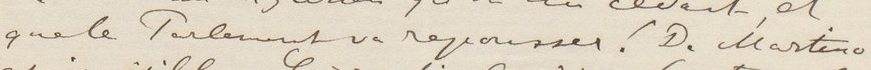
que le Parlement va repousser! De Martino
